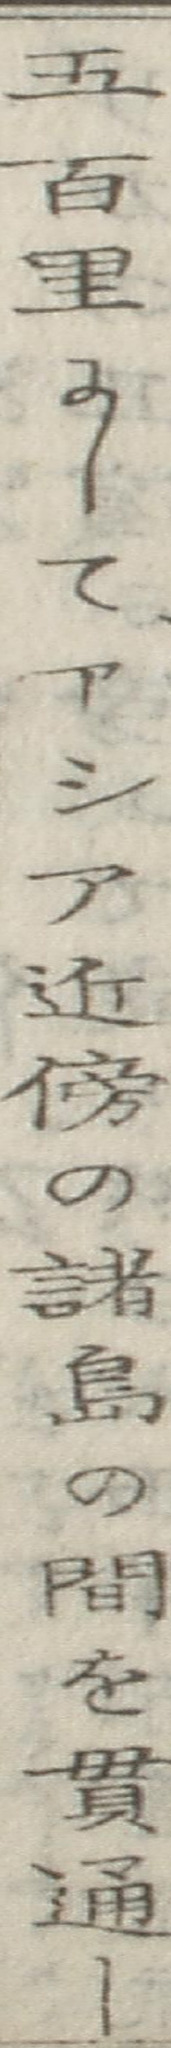五百里にして、アシア近傍の諸島の間を貫通し
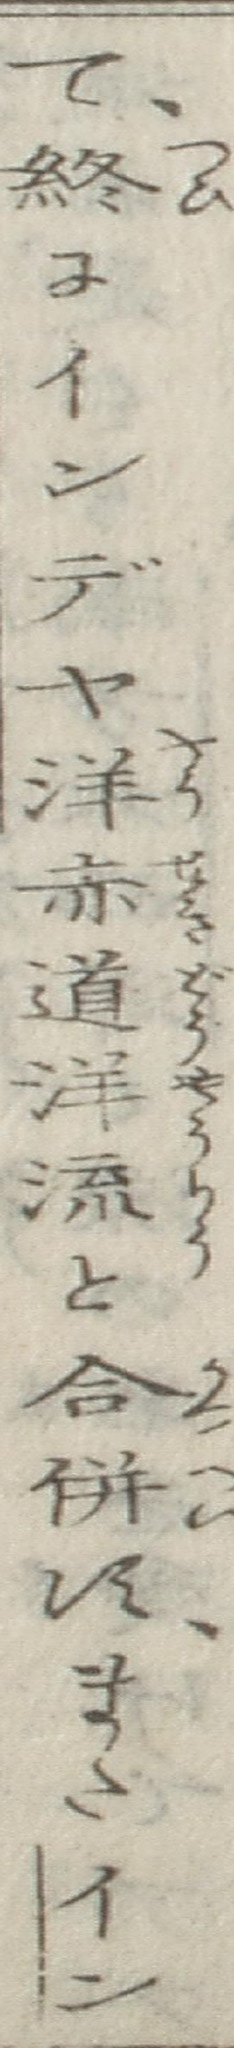て、終にインデヤ洋赤道洋流と合併す、またイン
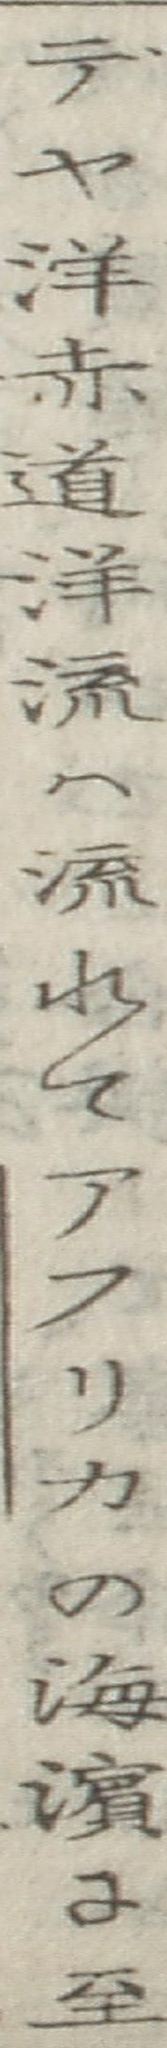デヤ洋赤道洋流は、流れてアフリカの海浜に至
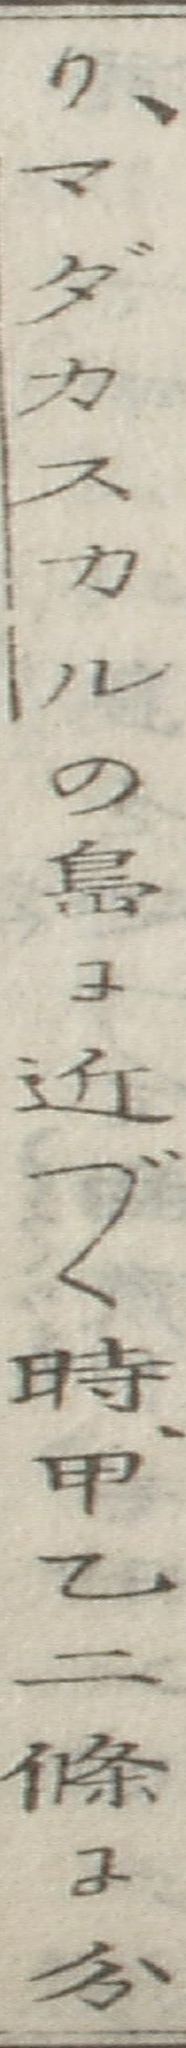り、マダカスカルの島に近づく時、甲乙二条に分

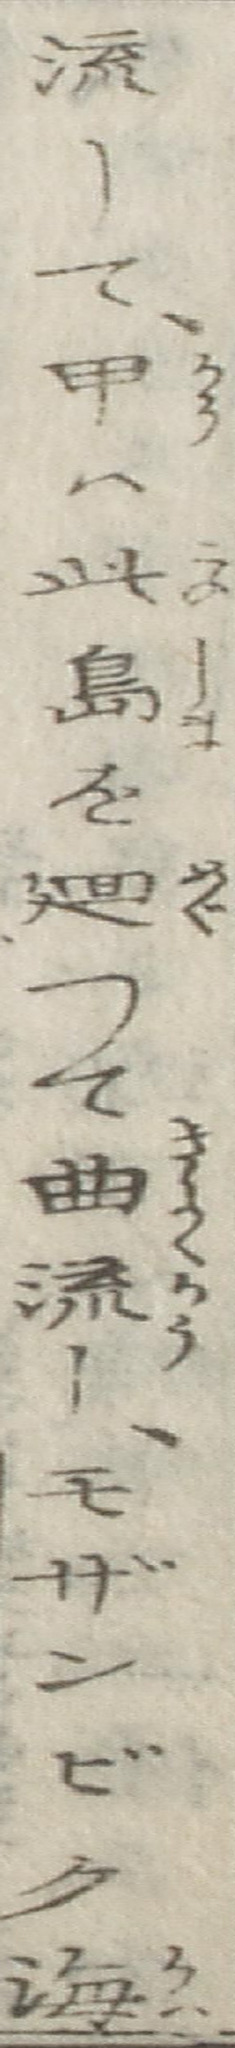流して、甲は此島を廻つて曲流し、モザンビク海
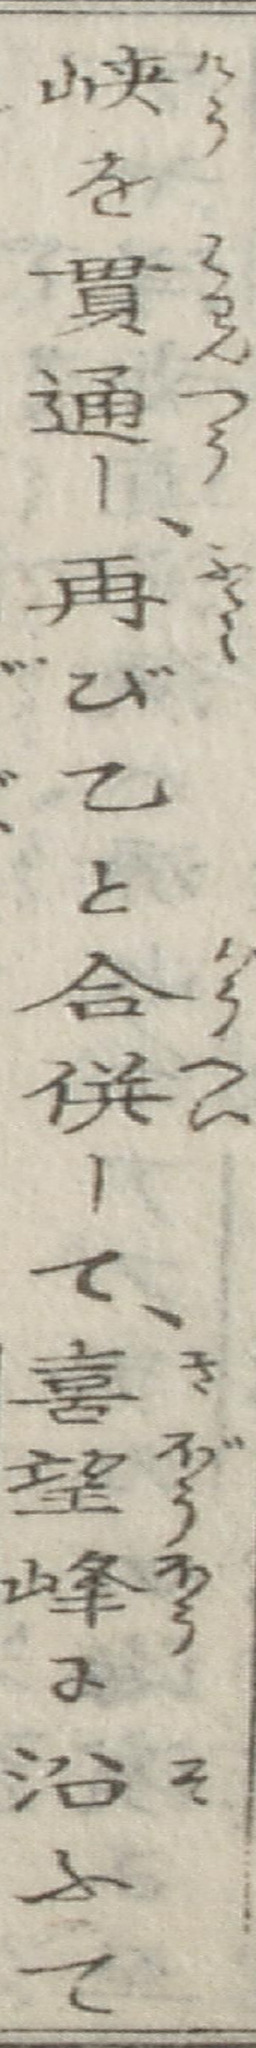峡を貫通し、再び乙と合併して、喜望峰に沿ふて
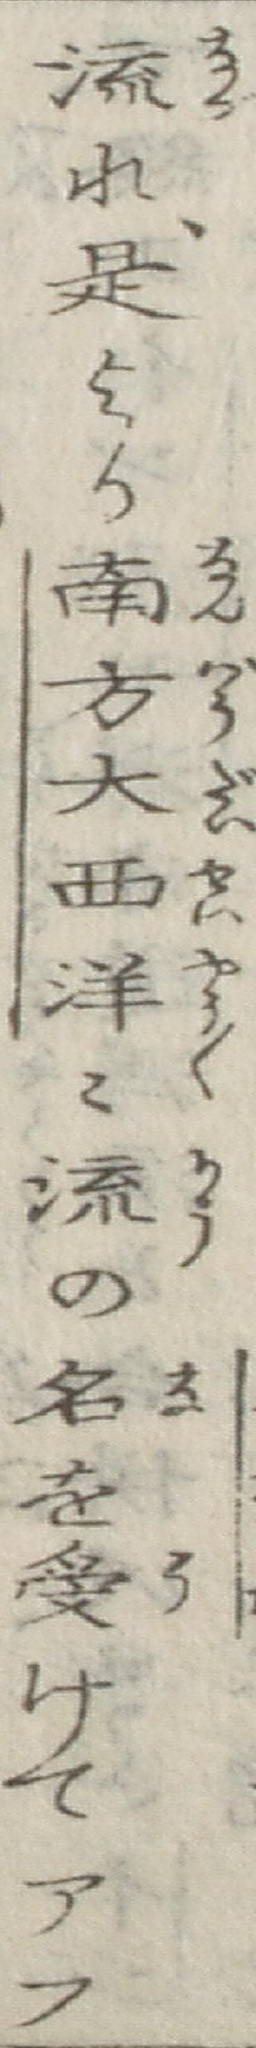流れ、是より南方大西洋〻流の名を受けてアフ
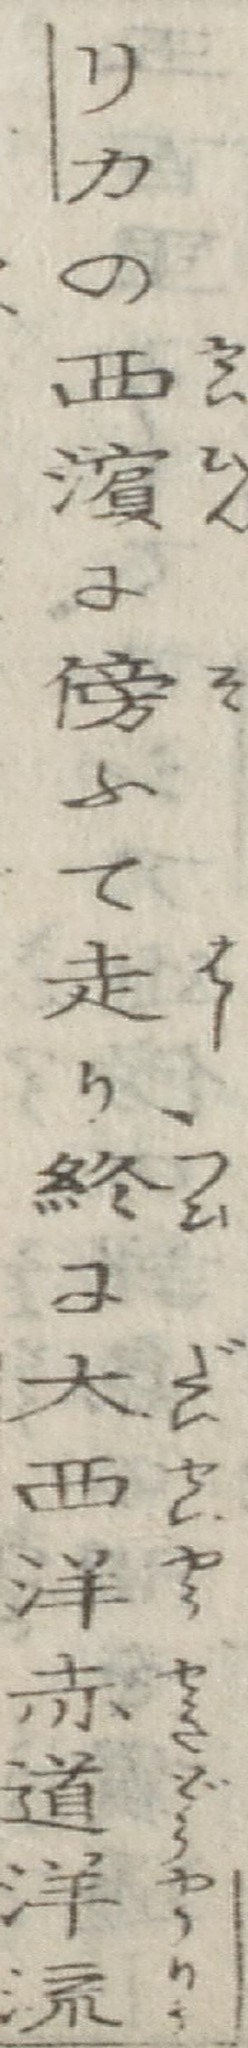リカの西浜に傍ふて走り、終に大西洋赤道洋流
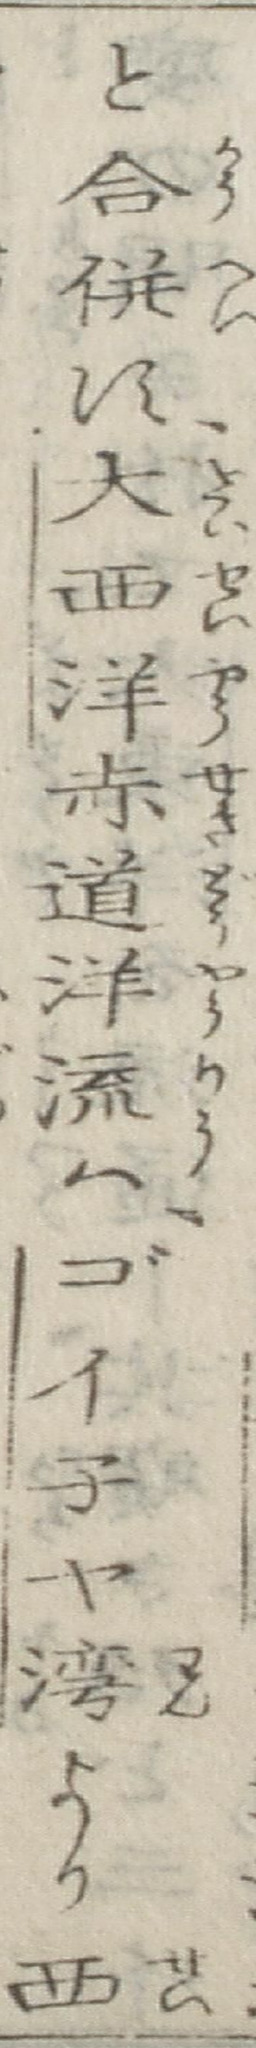と合併す、大西洋赤道洋流は、ゴイネヤ湾より西
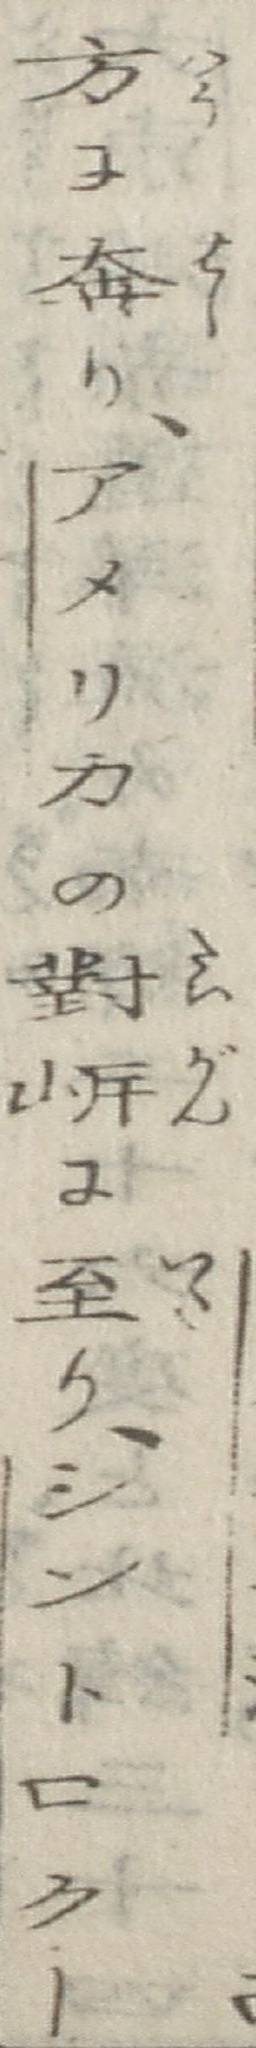方に奔り、アメリカの対岸に至り、シントロクー
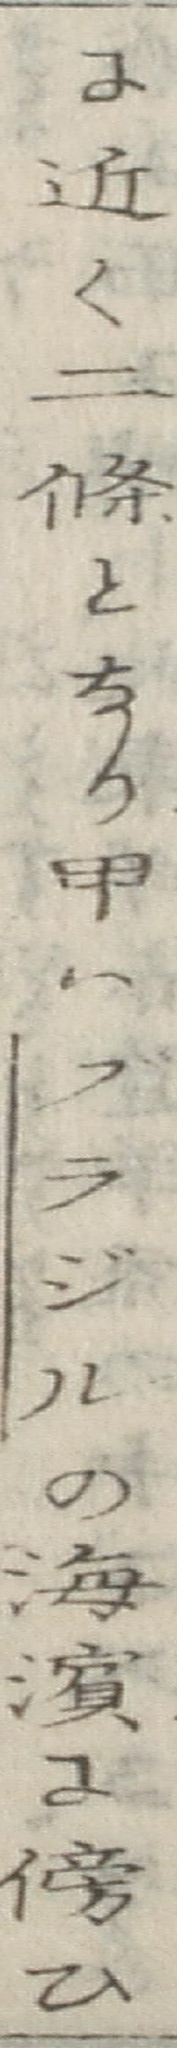に近く二條となり、甲はブラジルの海浜に傍ひ
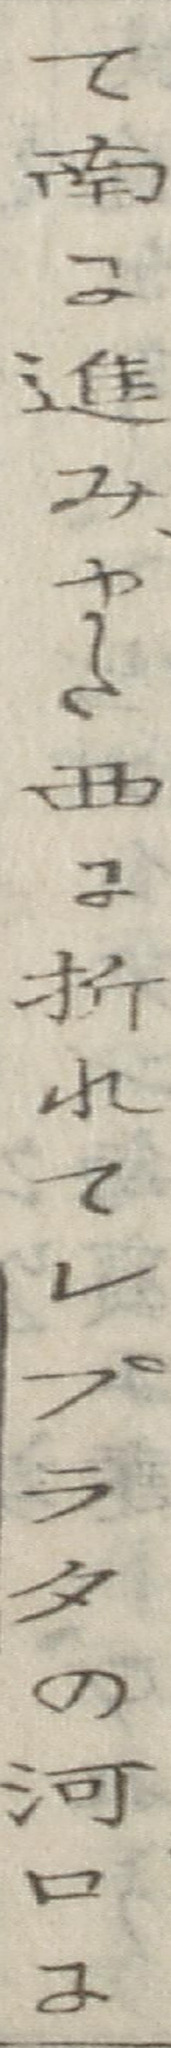て南に進み、また西に折れてレプラタの河口に
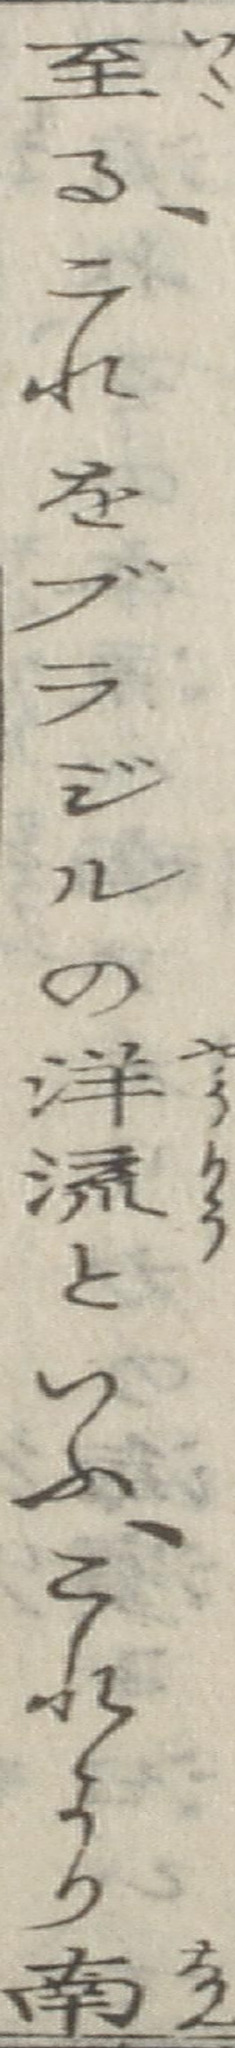至る、これをブラジルの洋流といふ、これより南
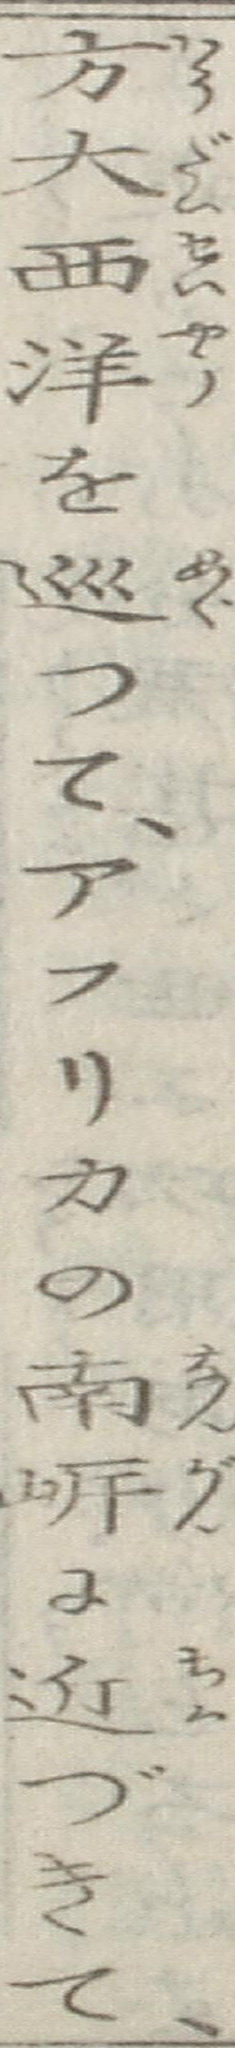方大西洋を巡つて、アフリカの南岸に近づきて、
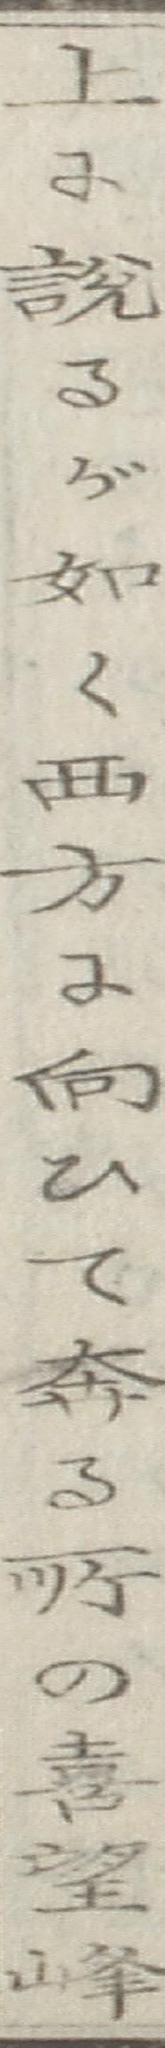上に説るが如く、西方に向ひて奔る所の喜望峰
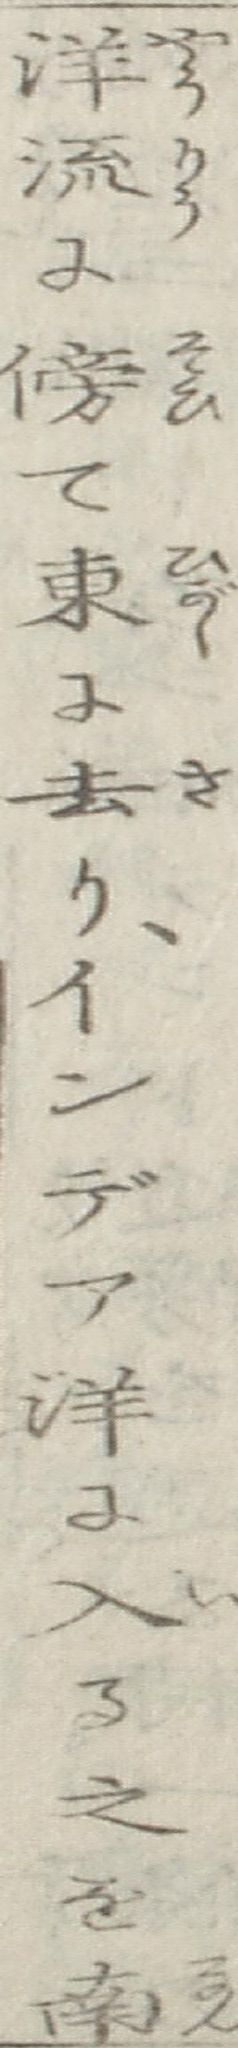洋流に傍て東に去り、インデア洋に入る之を南
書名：訓蒙　天然地理學　中
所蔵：東京大学地震研究所図書室 Earthquake Research Institute Library, The University of Tokyo, JAPAN
